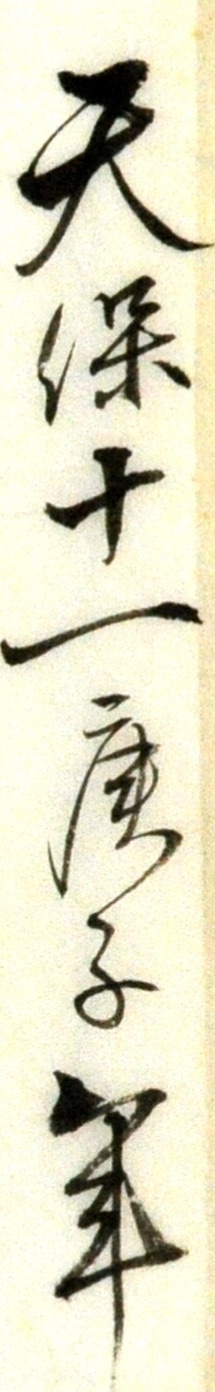天保十一庚子年
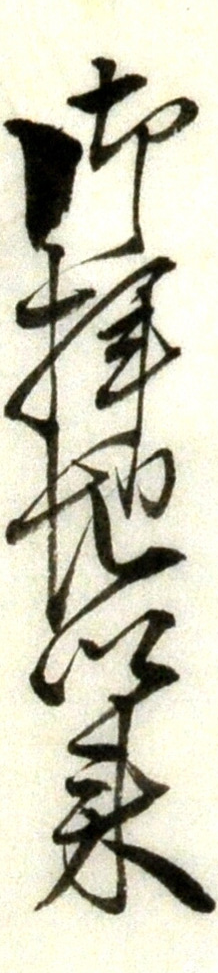御拝地以来
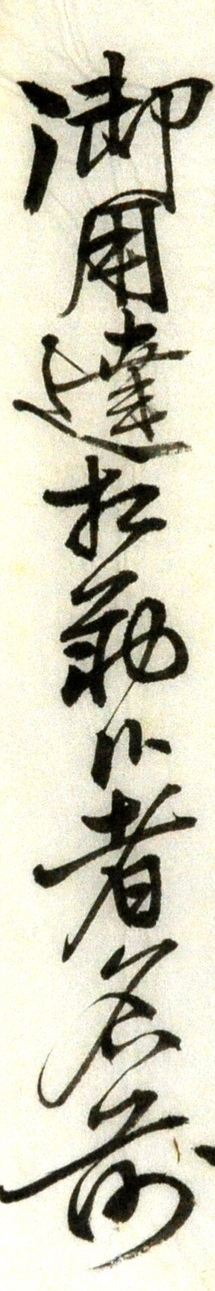御用達相勤候者名前

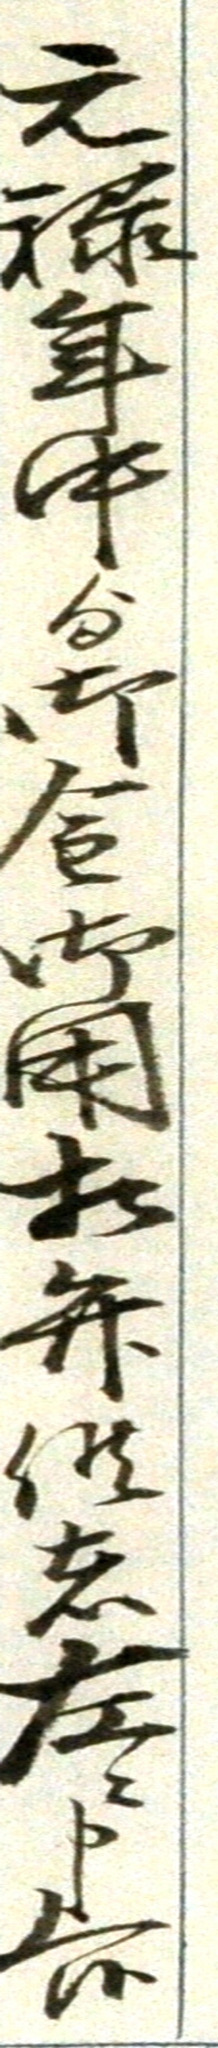元禄年中ゟ御金御用相弁候者左に申上候
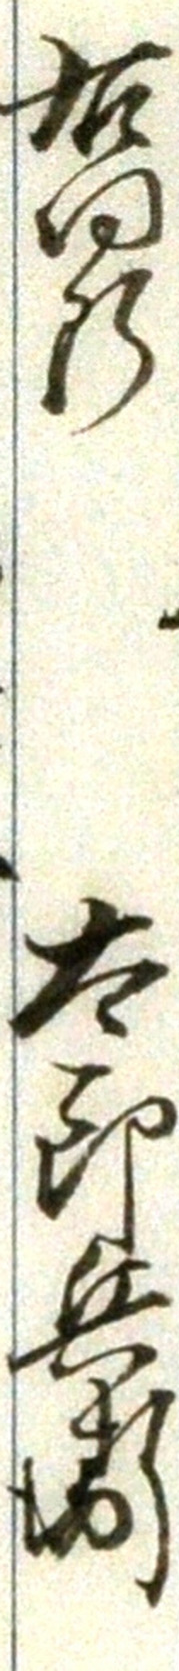右同断太郎兵衛
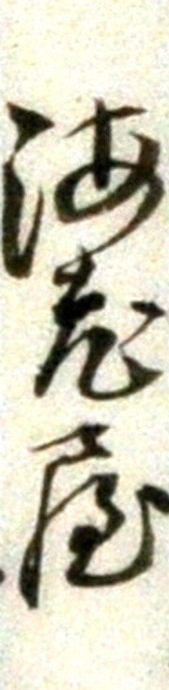海老屋
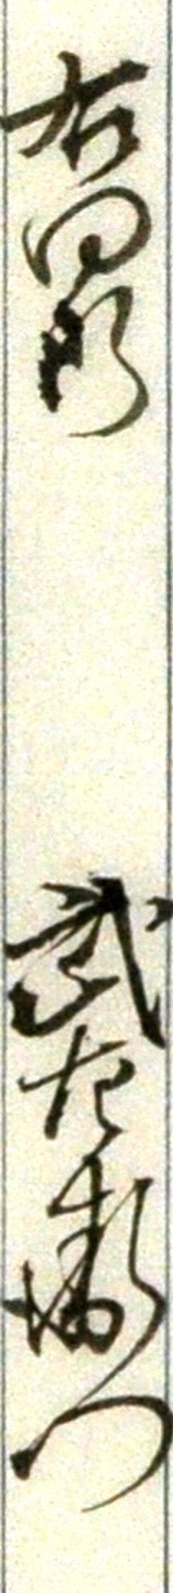右同断武左衛門
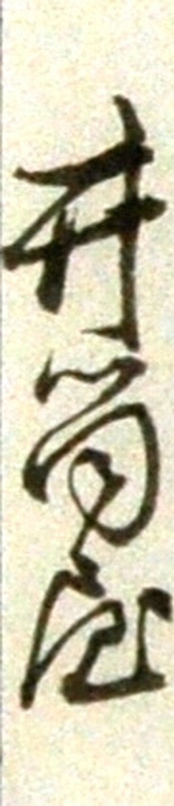井筒屋
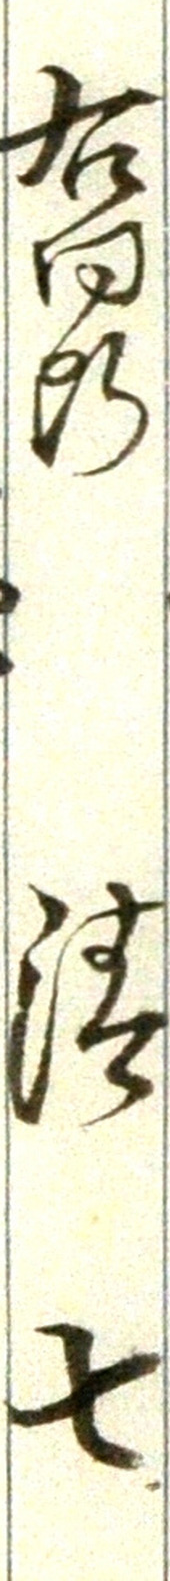右同断清七

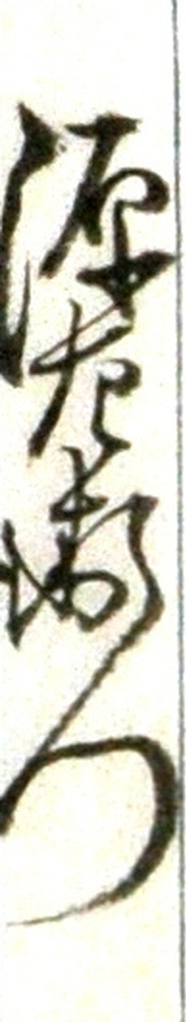利左衛門
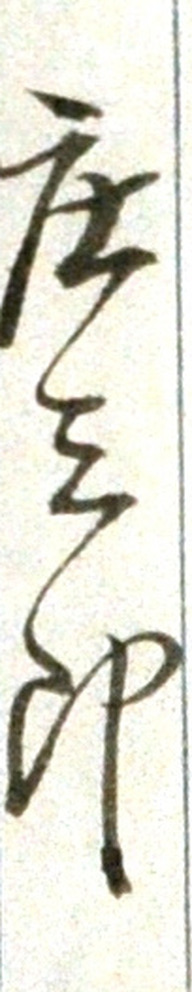七三郎
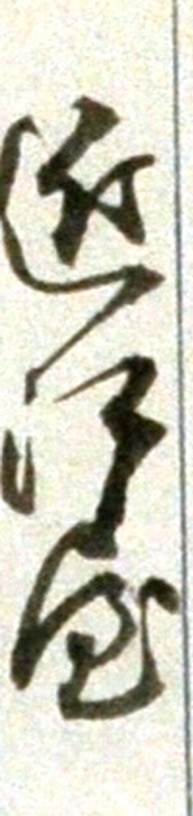近江屋
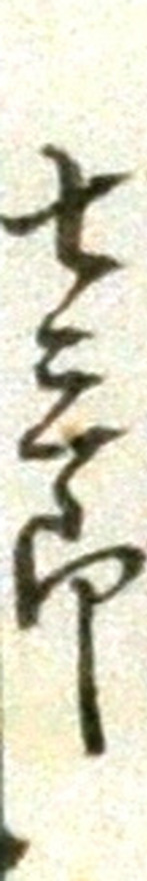七三郎
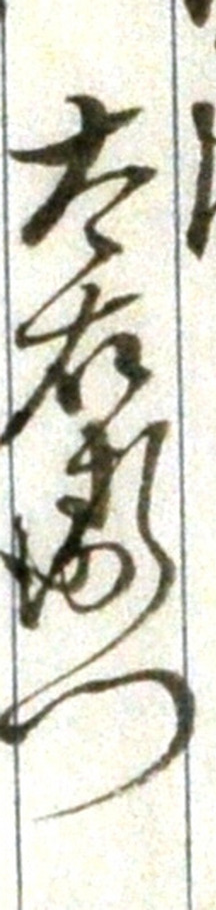甚右衛門
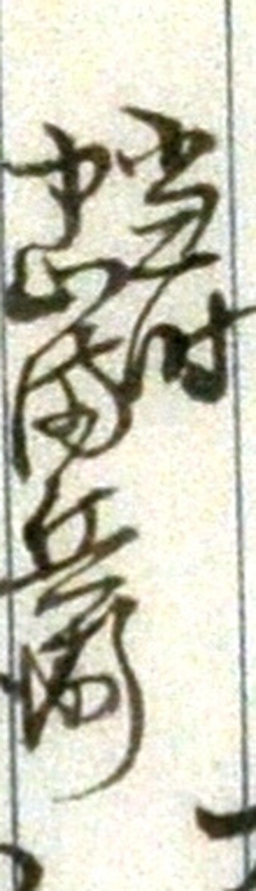中山満兵衛
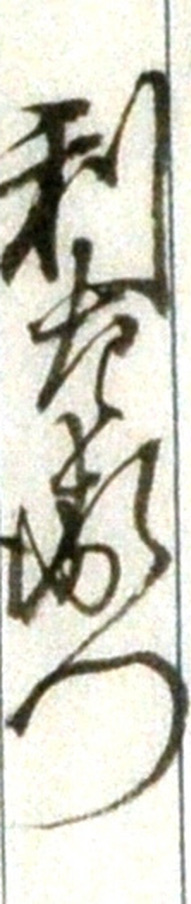利左衛門
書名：御拝地以来御用達相勤候者名前
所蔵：伊那市立高遠町図書館・合同会社AMANE
